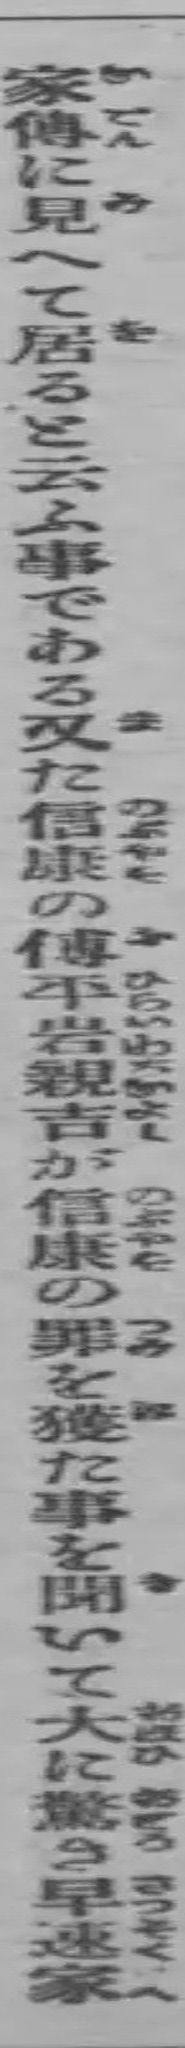家伝に見へて居ると云ふ事である又た信康の傅平岩親吉が信康の罪を獲た事を聞いて大に驚き早速家
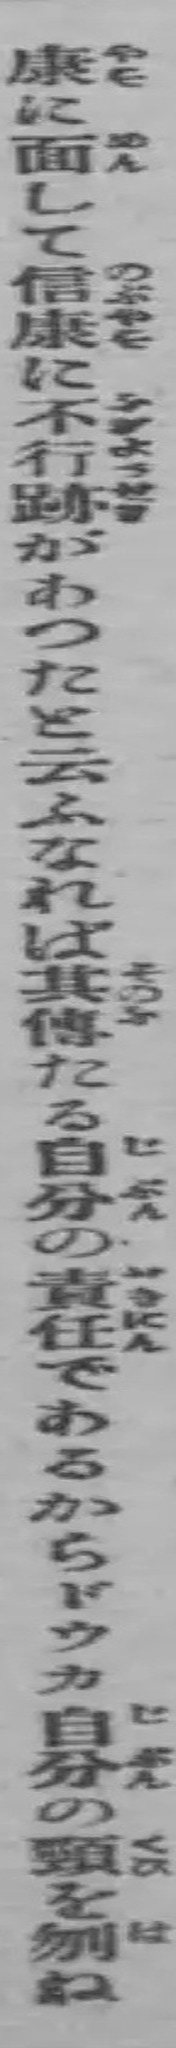康に面して信康に不行跡があつたと云ふなれば其傅たる自分の責任であるからドウカ自分の頸を刎ね
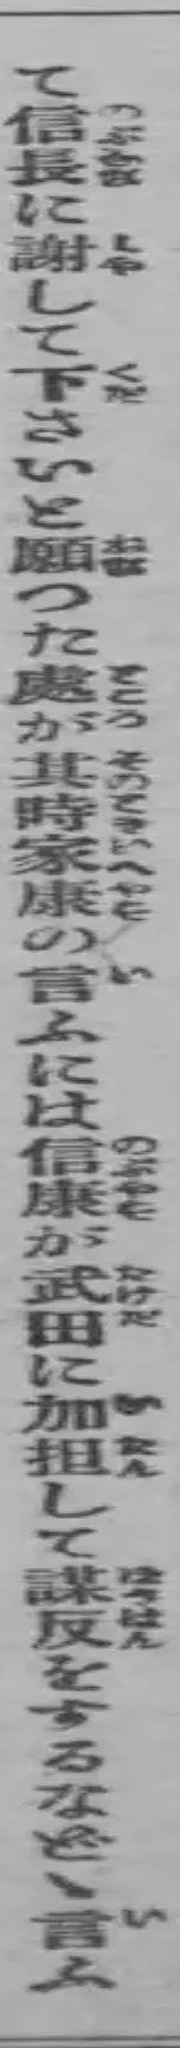て信長に謝して下さいと願つた処が其時家康の言ふには信康が武田に加担して謀反をするなどゝ言ふ
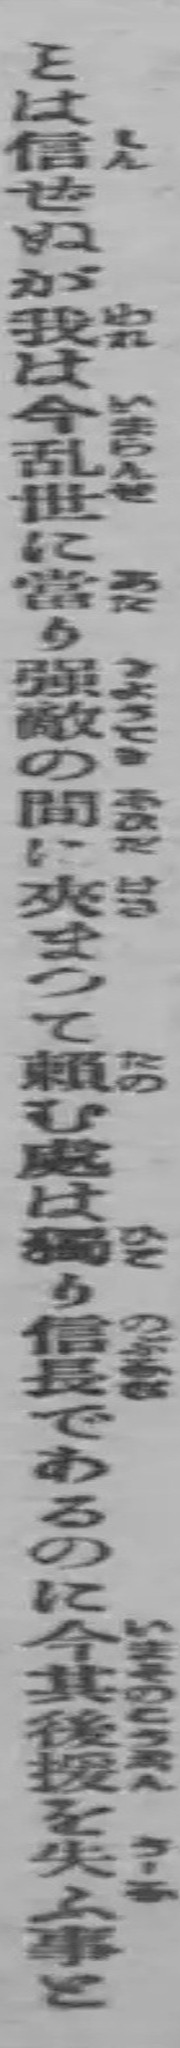ことは信ぜぬが我は今乱世に当り強敵の間に夾まつて頼む処は独り信長であるのに今其後援を失ふ事と
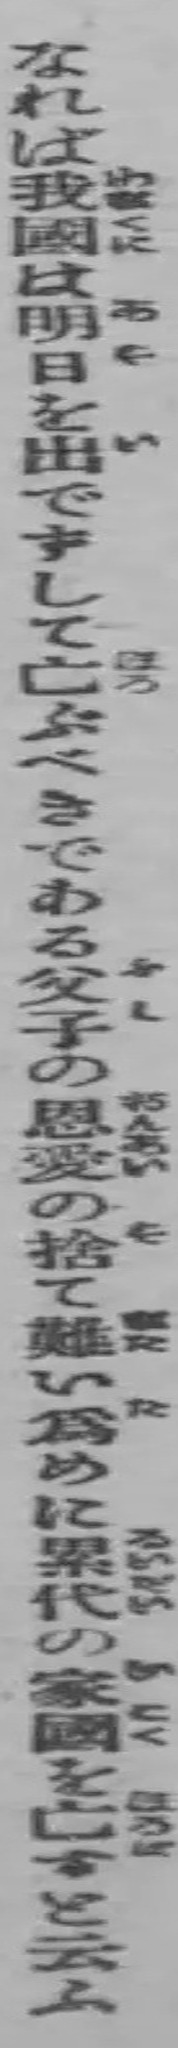なれば我国は明日を出でずして亡ぶべきである父子の恩愛の捨て難い為めに累代の家国を亡すと云ふ
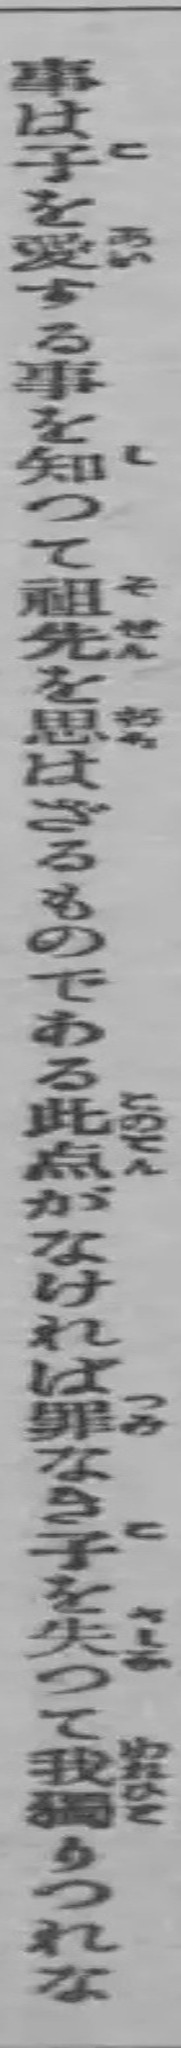事は子を愛する事を知つて祖先を思はざるものである此点がなければ罪なき子を失つて我独りつれな
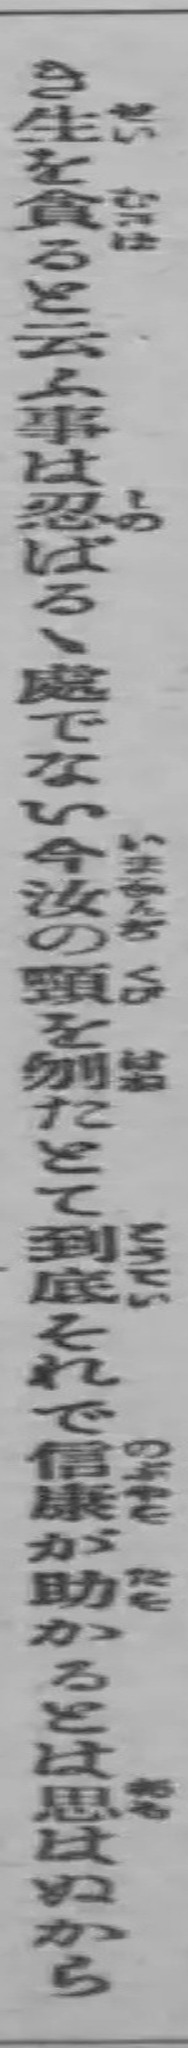き生を貪ると云ふ事は忍ばるゝ処でない今汝の頸を刎たとて到底それで信康が助かるとは思はぬから
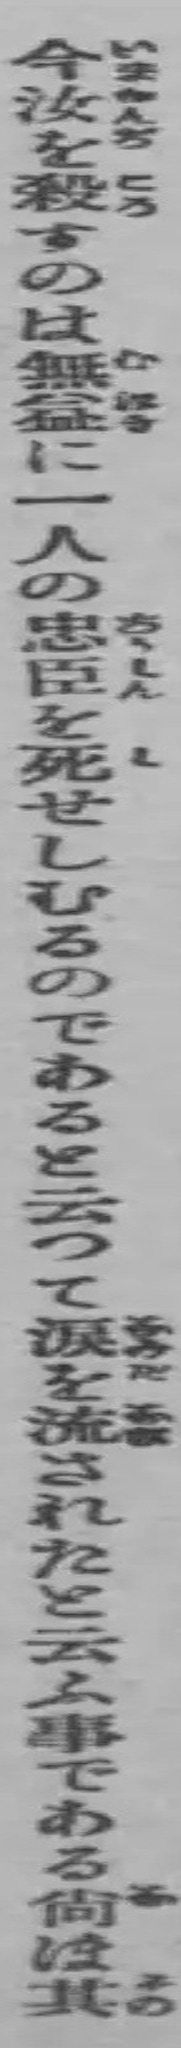今汝を殺すのは無益に一人の忠臣を死せしむるのであると云つて涙を流されたと云ふ事である尚ほ其
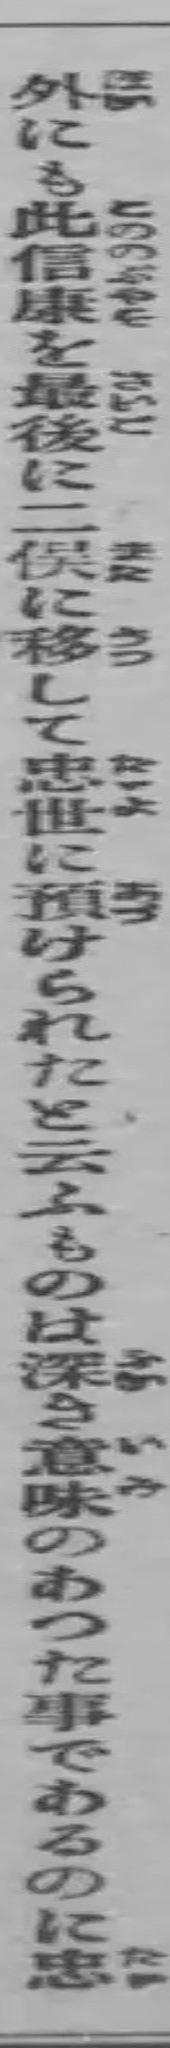外にも此信康を最後に二俣に移して忠世に預けられたと云ふものは深き意味のあつた事であるのに忠
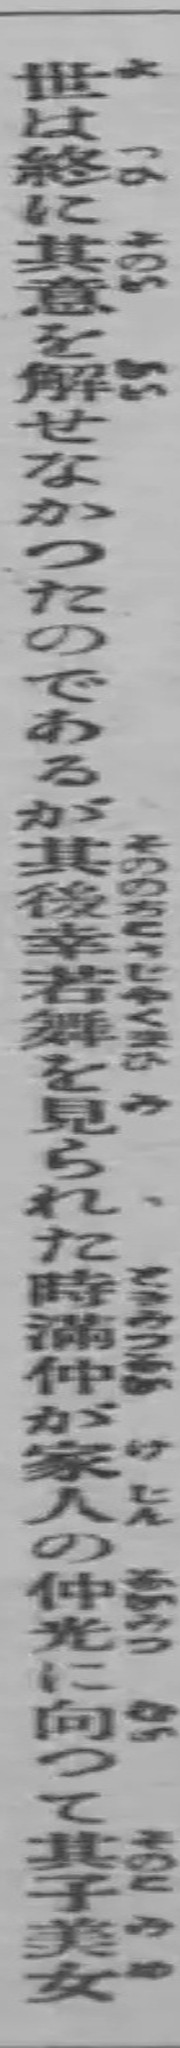世は終に其意を解せなかつたのであるが其後幸若舞を見られた時満仲が家人の仲光に向つて其子美女
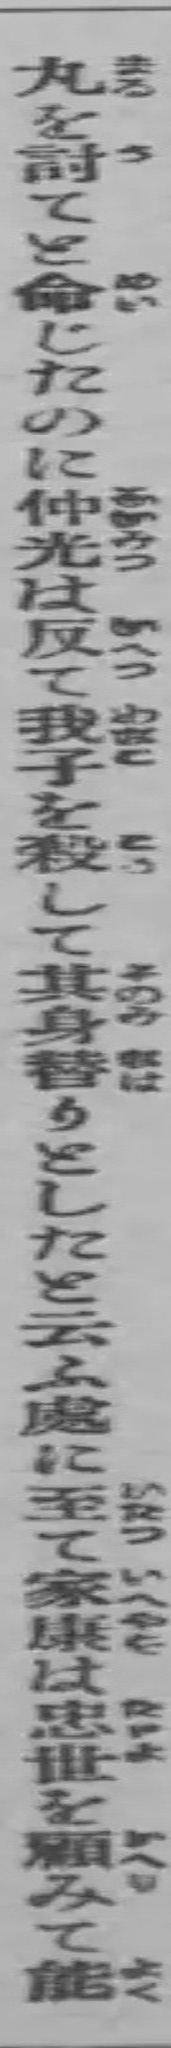丸を討てと命じたのに仲光は反て我子を殺して其身替りとしたと云ふ処に至て家康は忠世を顧みて能
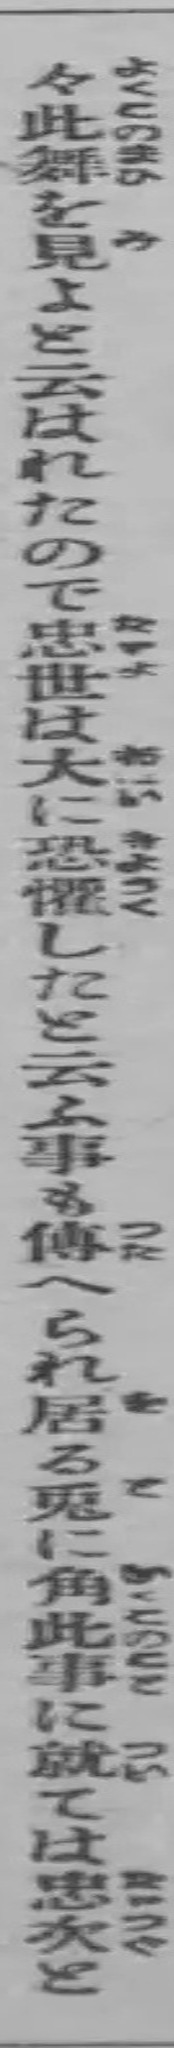能此舞を見よと云はれたので忠世は大に恐懼したと云ふ事も伝へられ居る兎に角此事に就ては忠次と
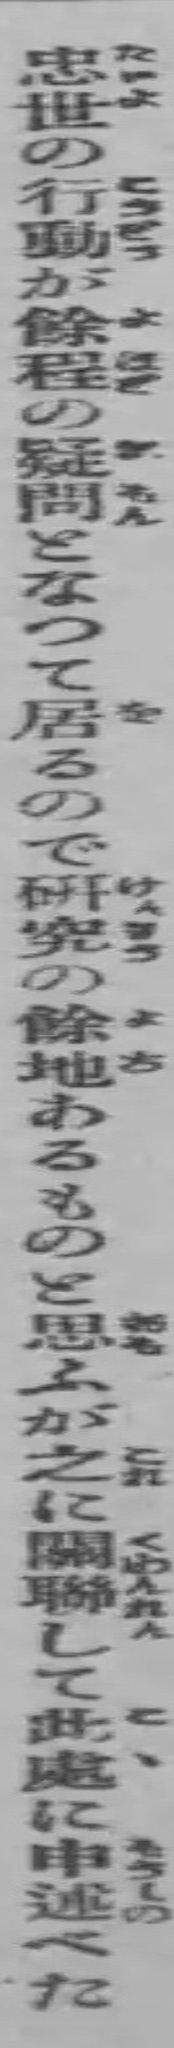忠世の行動が余程の疑問となつて居るので研究の余地あるものと思ふが之に関連して此処に申述べた
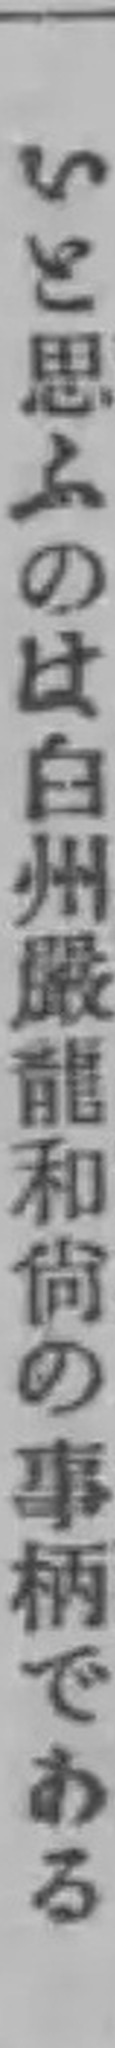いと思ふのは白州厳龍和尚の事柄である
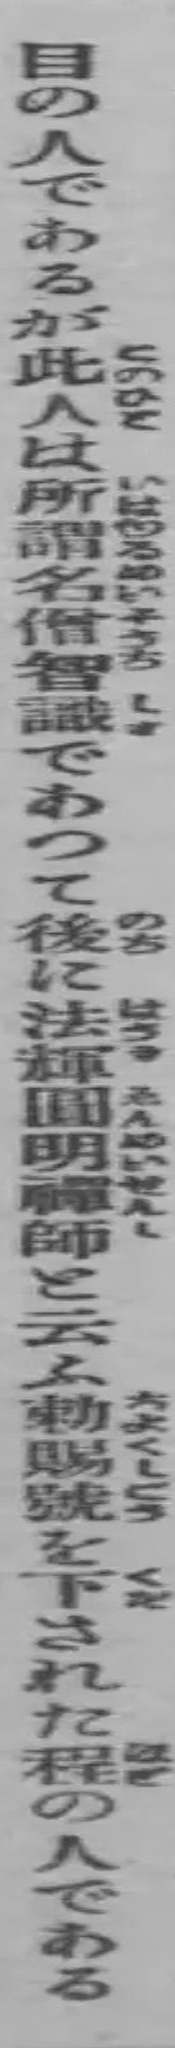との関係目の人であるが此人は所謂名僧智識であつて後に法輝円明禅師と云ふ勅賜号を下された程の人である
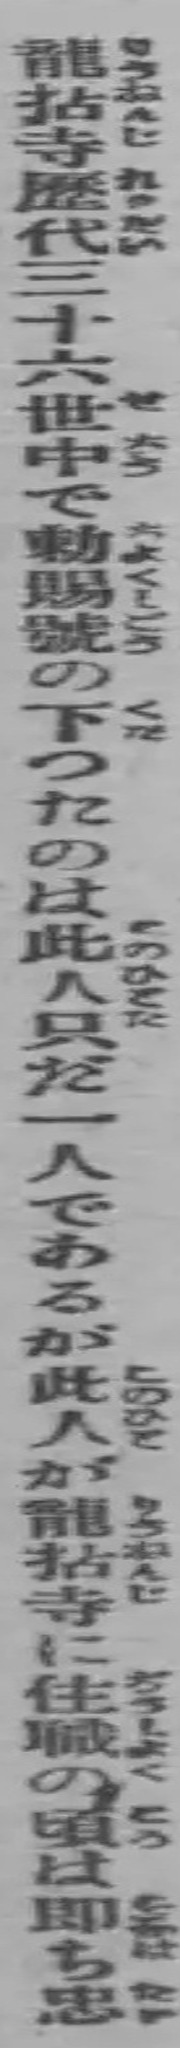龍拈寺歴代三十六世中で勅賜号の下つたのは此人只だ一人であるが此人が龍拈寺に住職の頃は即ち忠
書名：豊橋市史談
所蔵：国立国会図書館 National Diet Library, JAPAN
